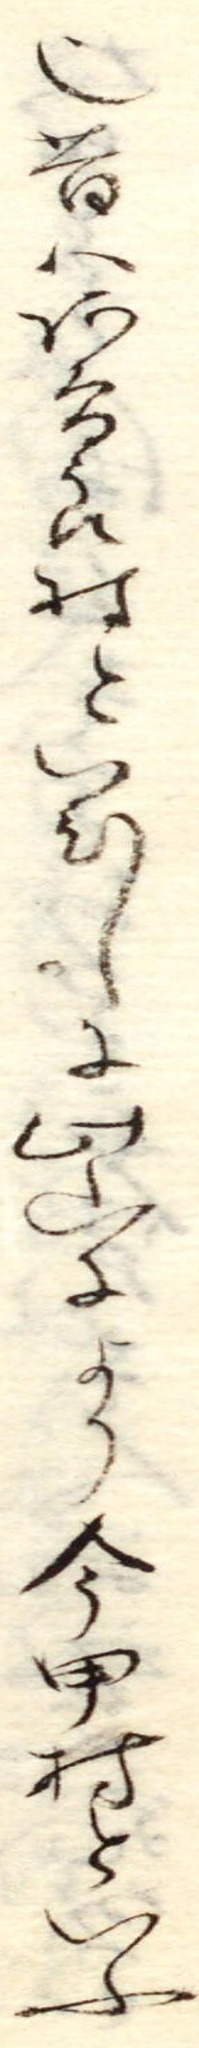也昔は阿曽良村といひしに此山により今甲村といふ
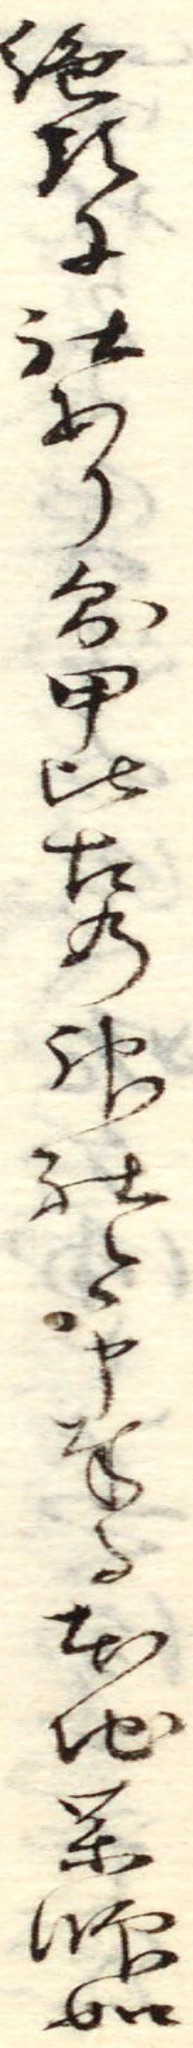絶に社あり則甲比古の神社と申奉る本地薬師如
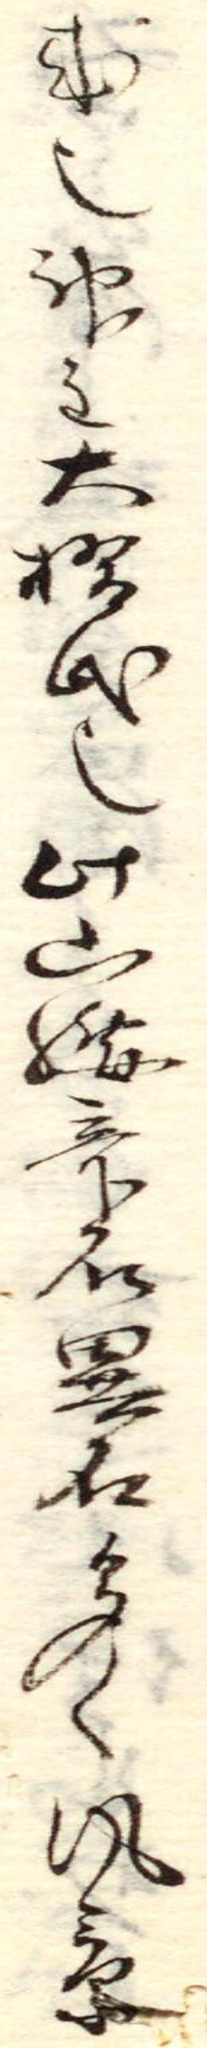来也神主大橋氏也此山腰奇名異名多く風景
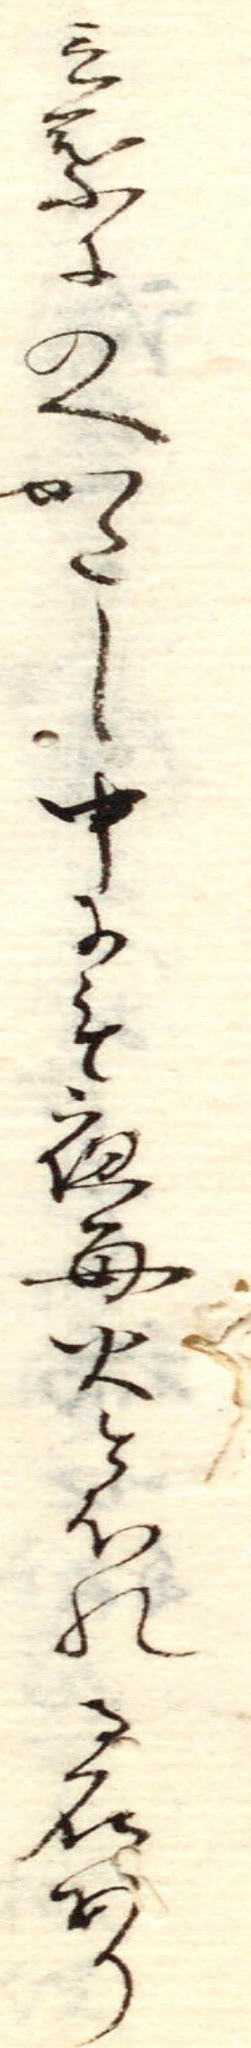言葉にのへかたし中にも夜毎火とほれる石あり
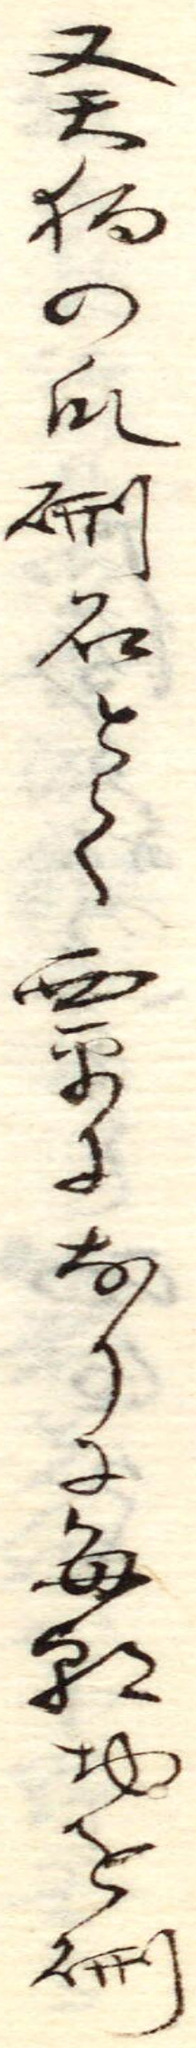又天狗の爪研石とて西平になりに毎朝物を研
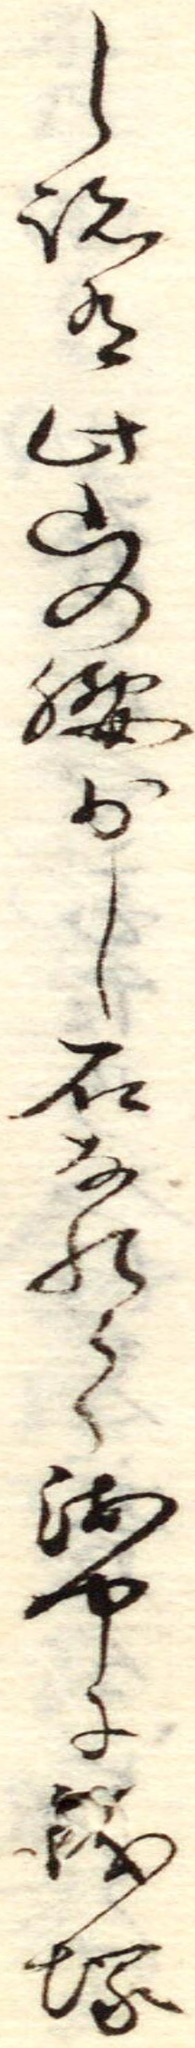し跡有此山の腰少し石なれて海中に塚
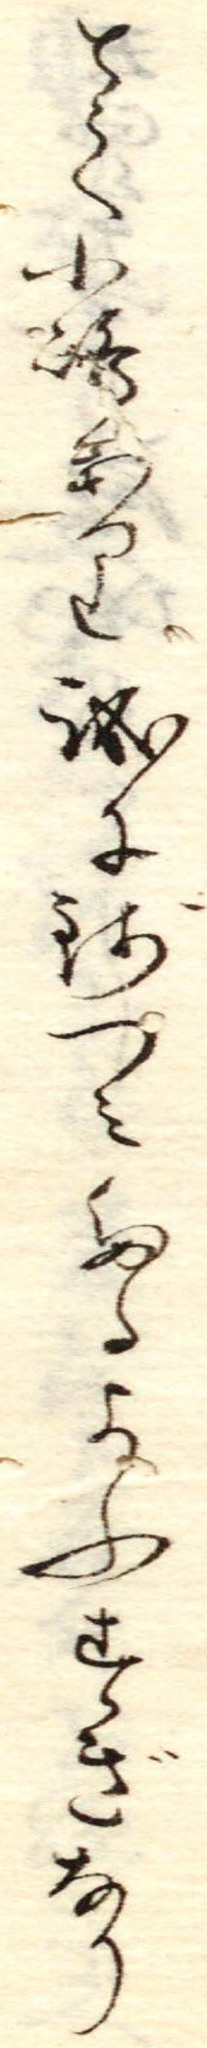とて小嶋あり誠に銭つみたるよふすぎなり
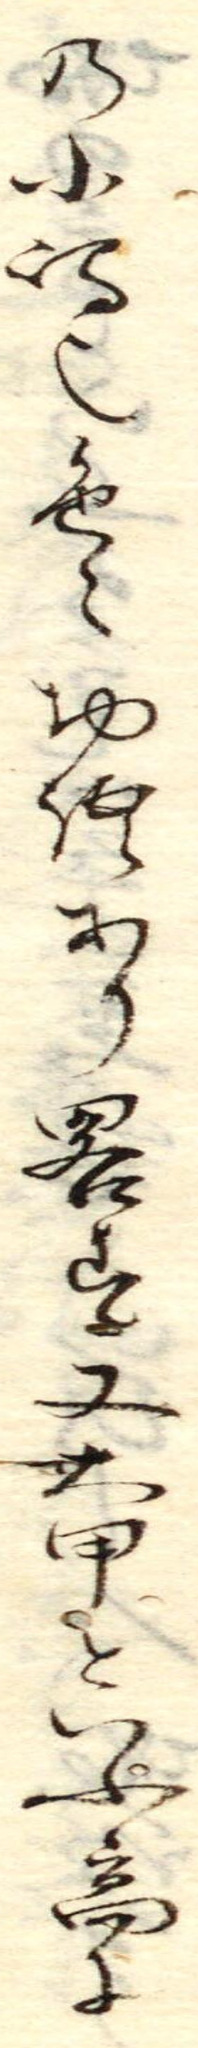の小嶋也色々物語あり略す又大甲といふ高に

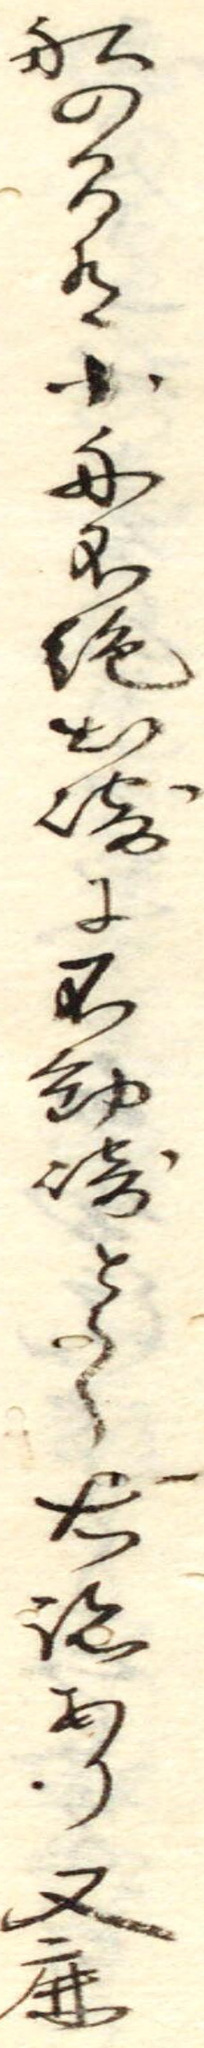船の間有小舟不絶出崎に不動崎とて右跡あり又鹿
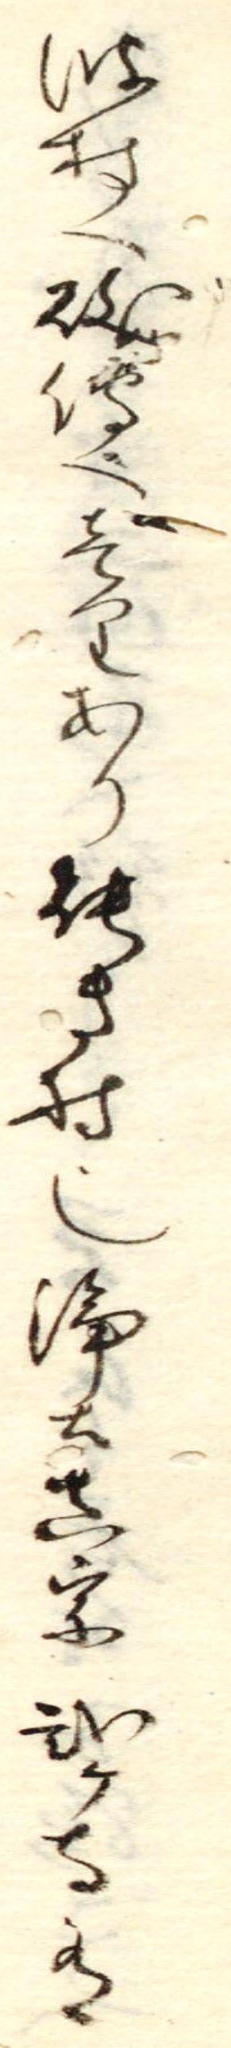波村へ礒伝へ市壱里ありよき村也浄土真宗弐ヶ寺有
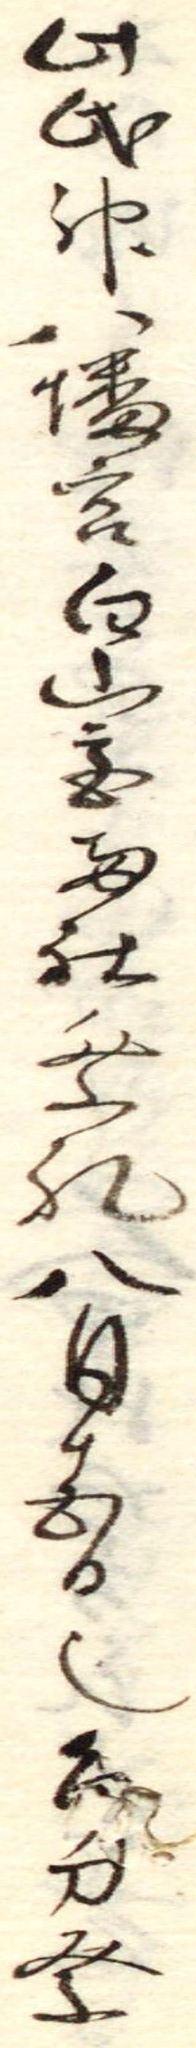此氏神八幡宮白山宮両社祭礼は八月十五日也角刀祭
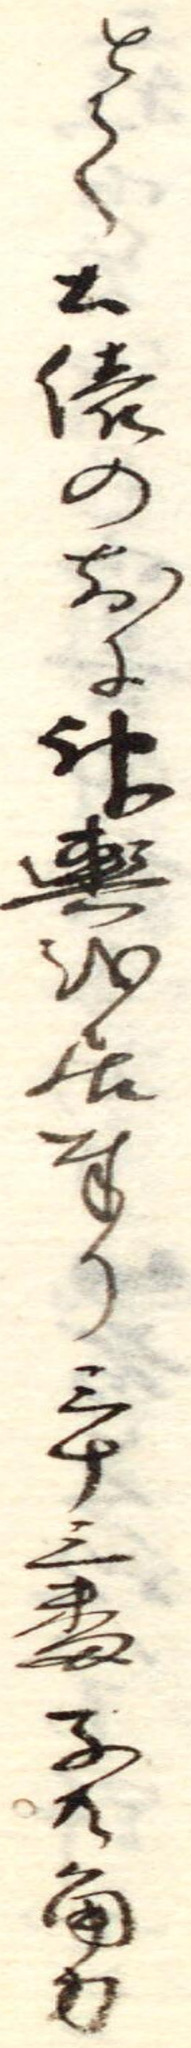とて土俵の前に神輿を居奉り三十三番子供角力
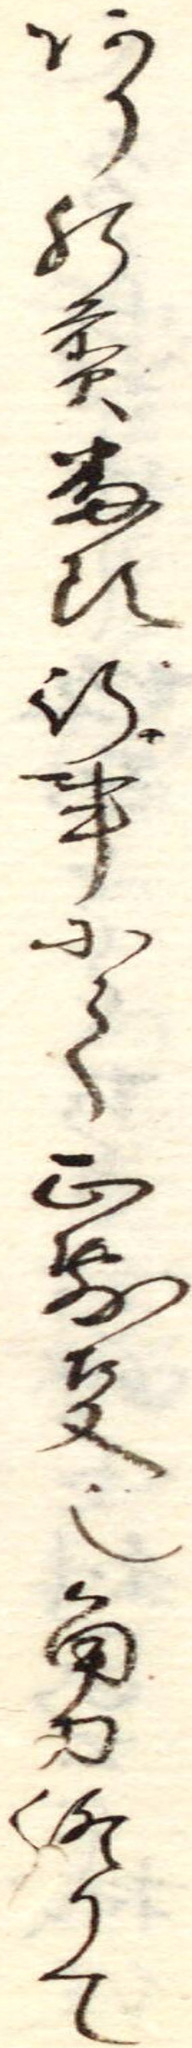あり肝煎番頭行事にて正敷事也角力終りて
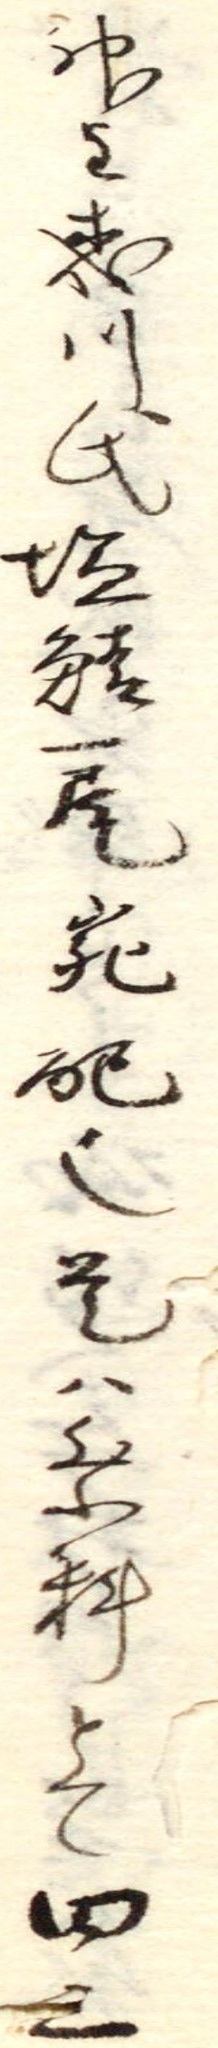神主森川氏塩鮭一尾宛配也是は祭料とて田三
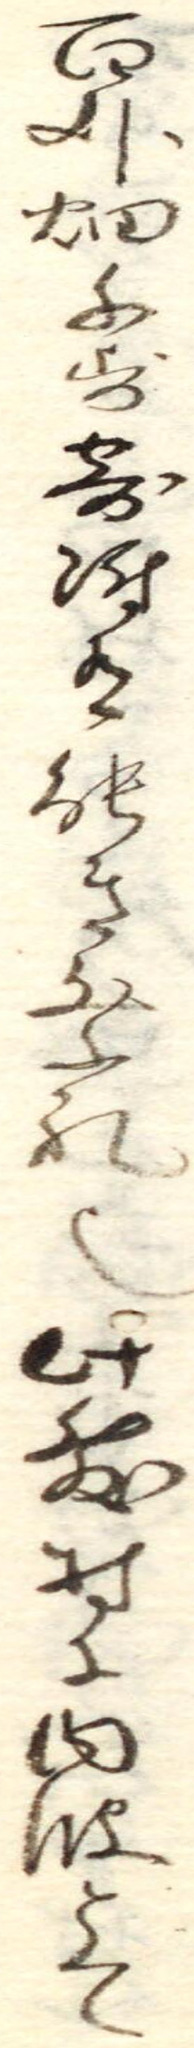百外畑千歩寄附有よき祭礼也此敷村に内波とて
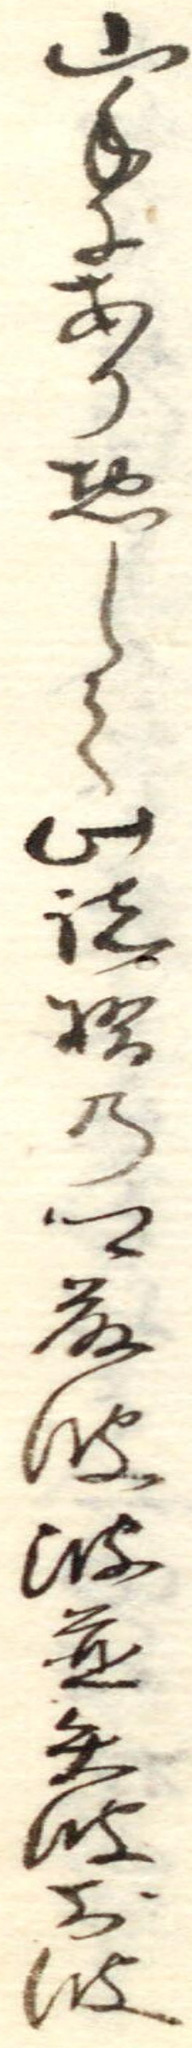山手にあり惣して此諸橋の郷藤波波並矢波前波
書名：能登名跡誌
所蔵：Ishikawa Prefectural Library
